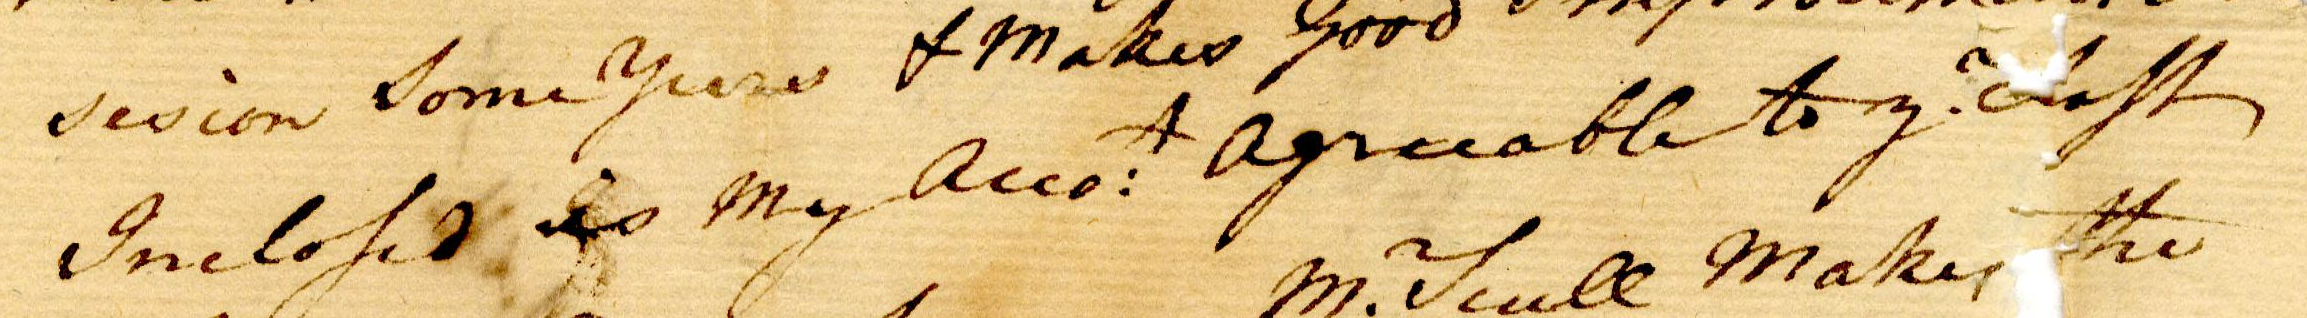Inclosed is my Acco^t: agreeable to y^r. Last
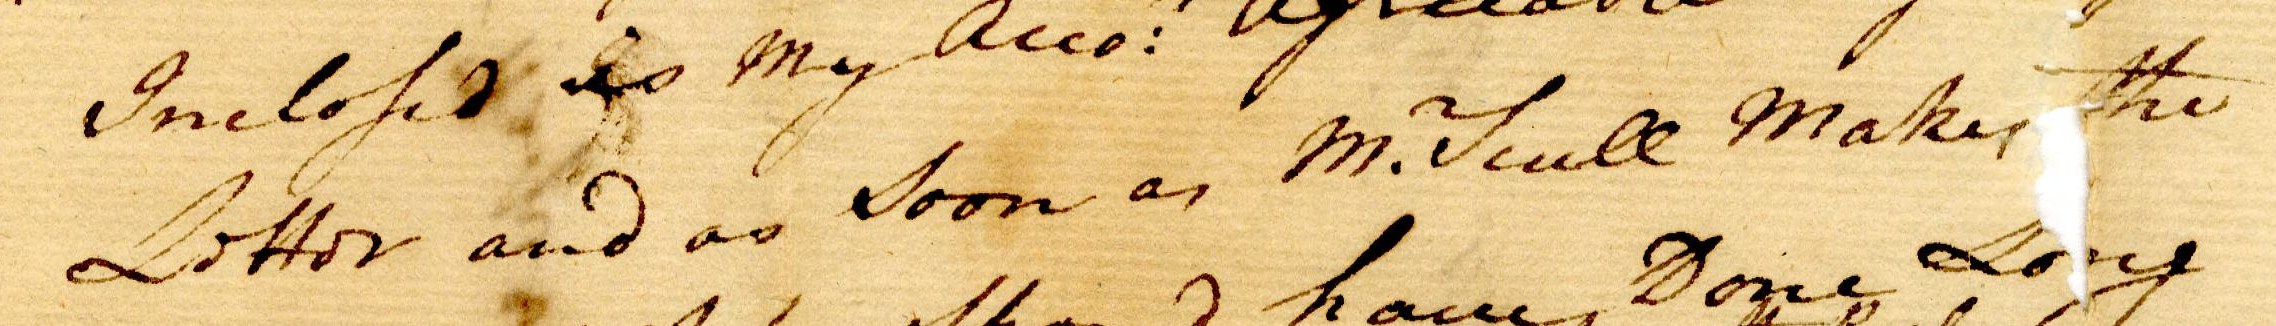Letter and as soon as M. Scull makes the
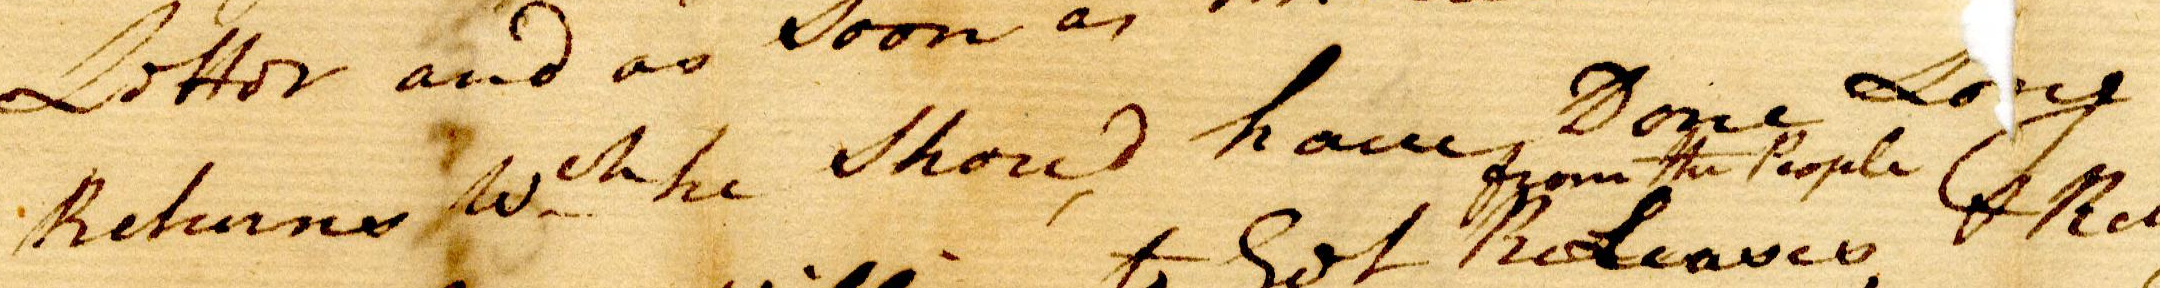Returns w^ch he shoud have Done Long
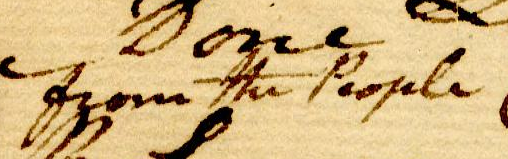from the People
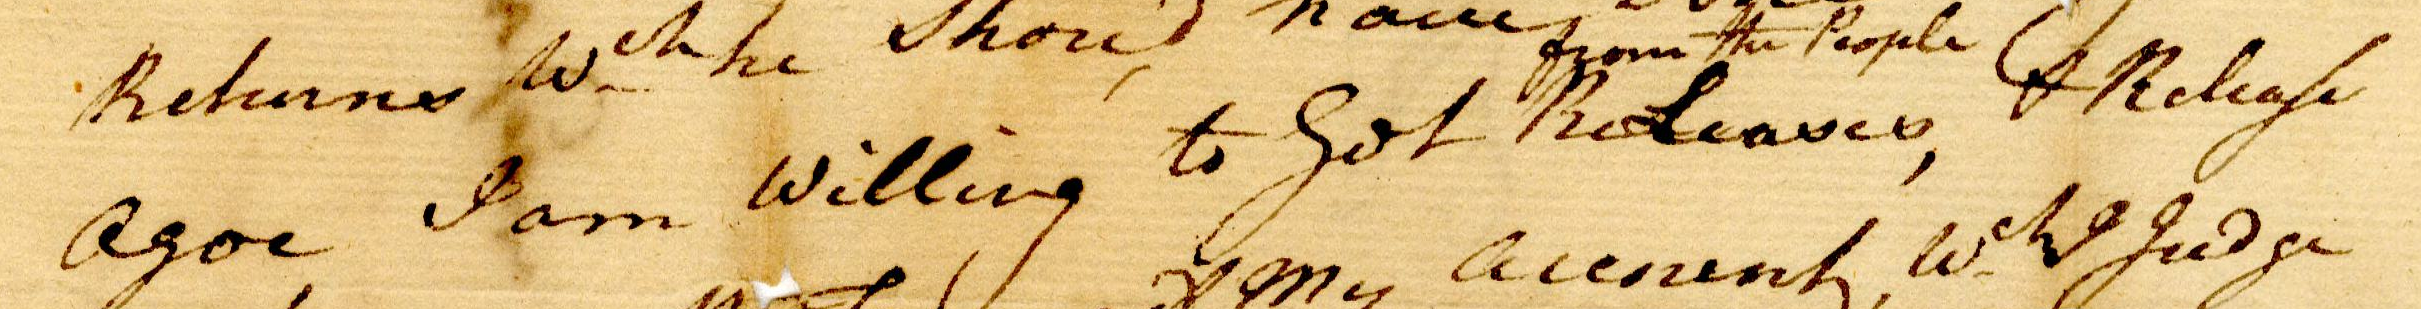agoe, I am willing to get Releases, & Release
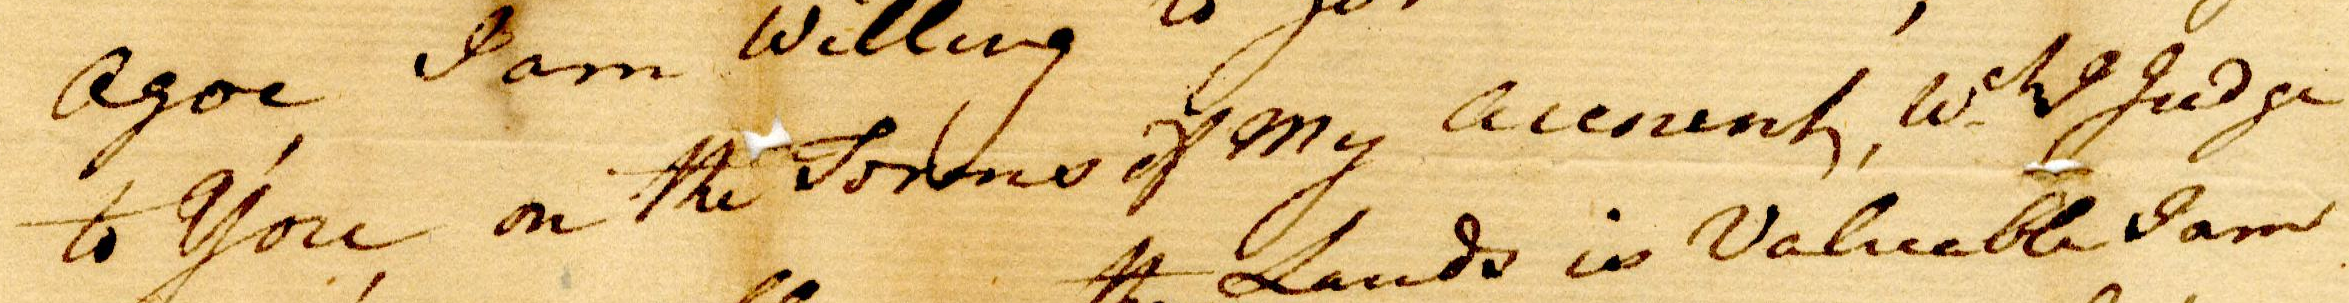to You on the Terms of my account, w^ch I Judge
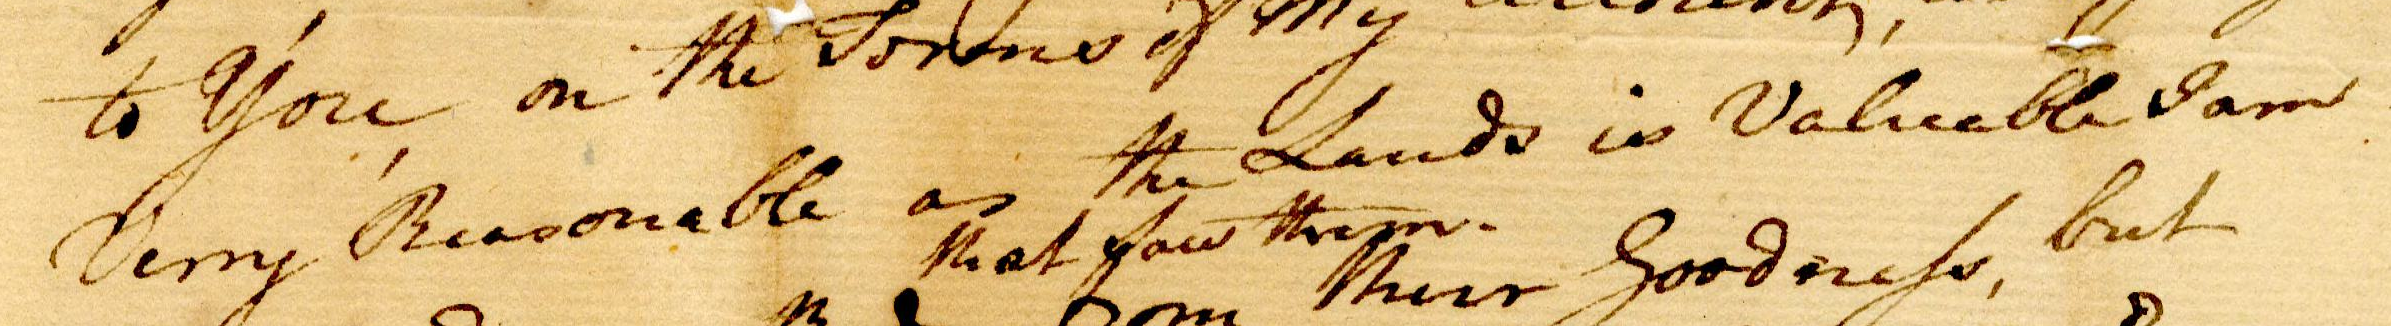verry Reasonable as the Lands is Valuable I am
